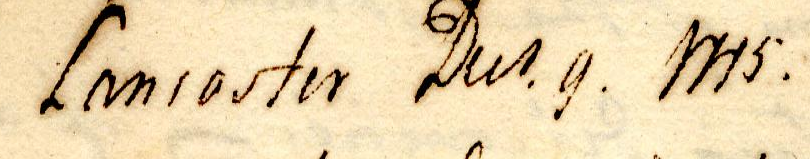Lancaster Dec^r. 9. 1775
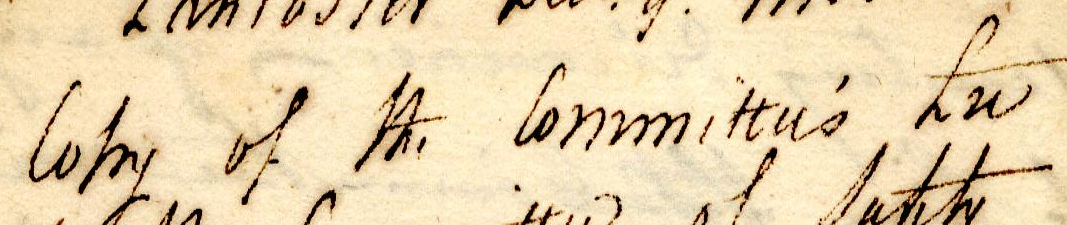Copy of the Committee's Lee
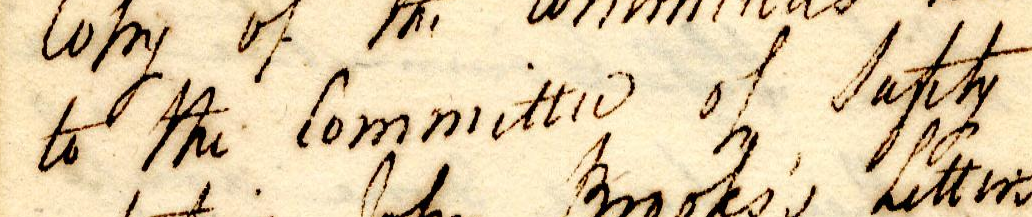to the Committee of Safety
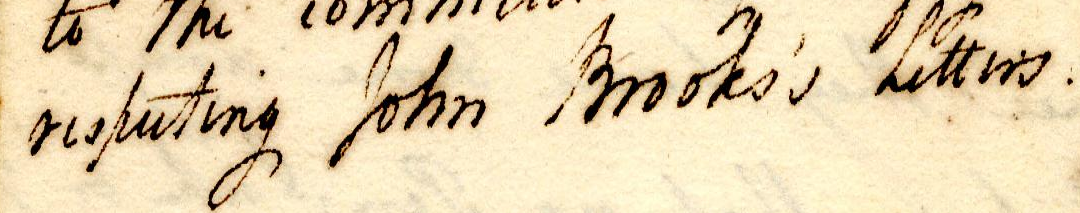respecting John Brooks's Letters
